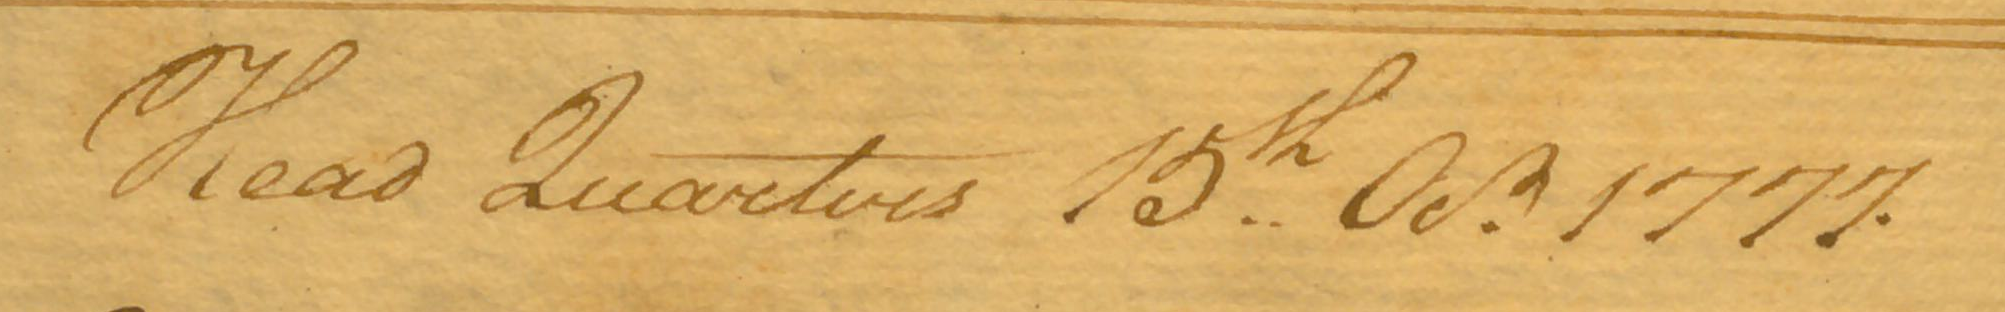Head Quarters 15^th. Oc^r. 1777.
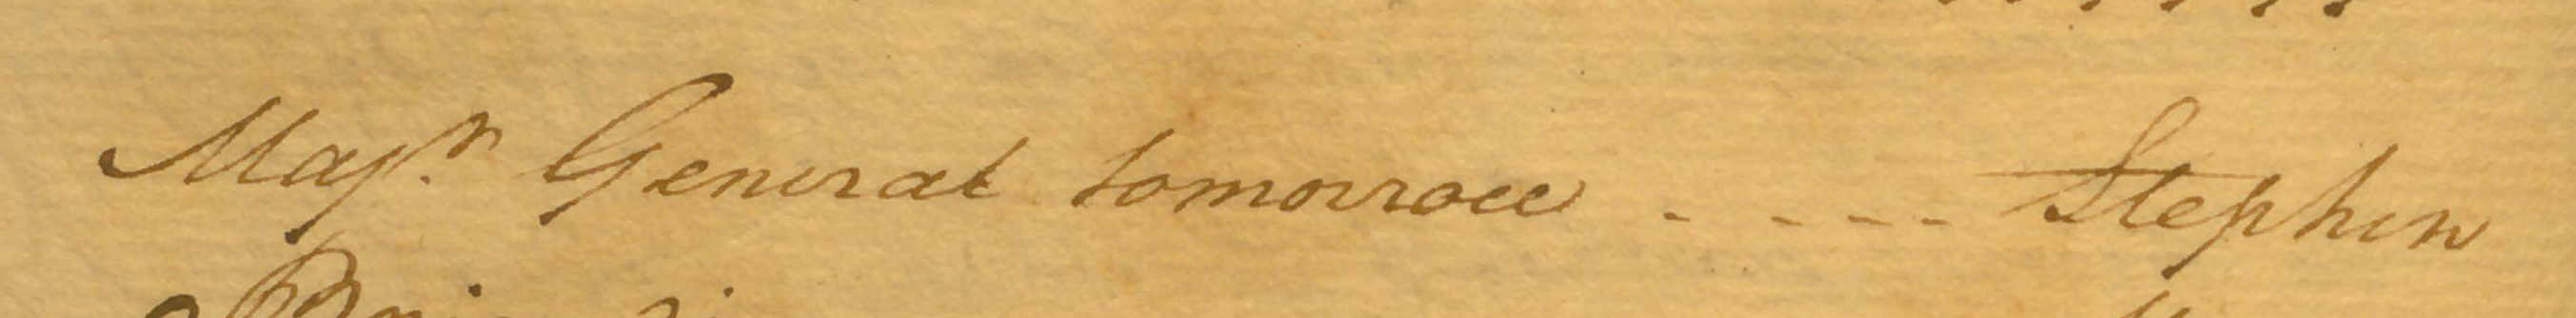Maj^r. General tomorrow .... Stephen
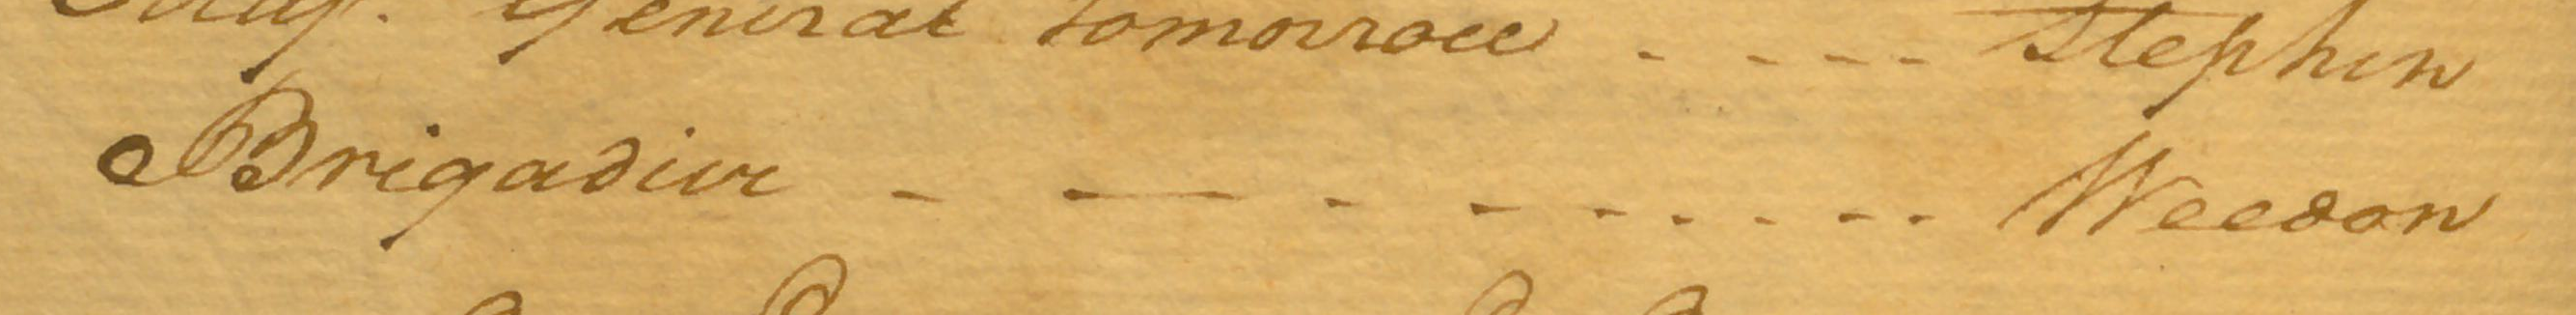Brigadier .......... Weedon
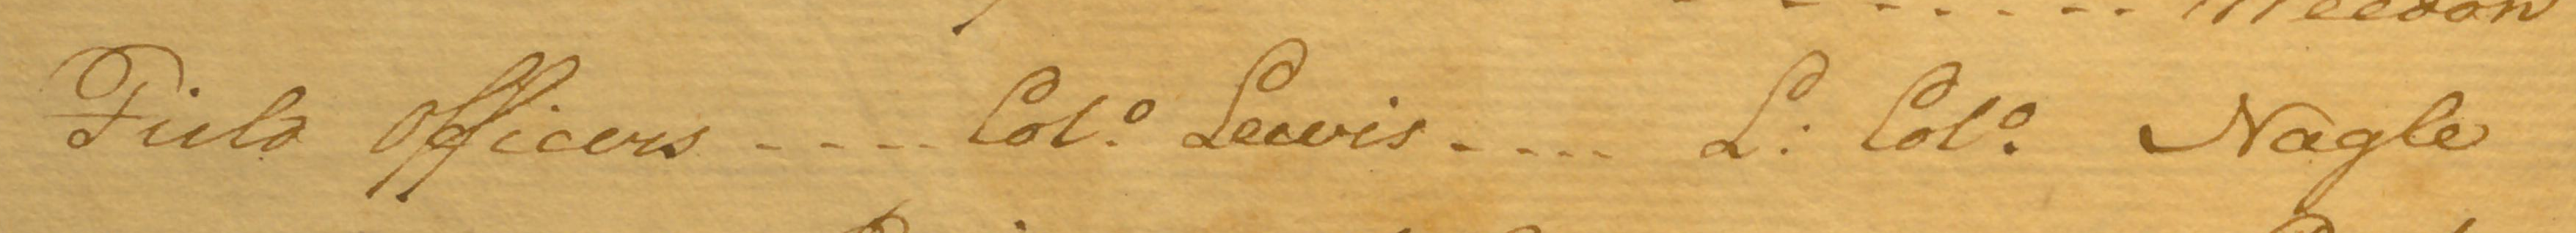Field officers .... Col^o. Lewis. ... L: Col^o. Nagle
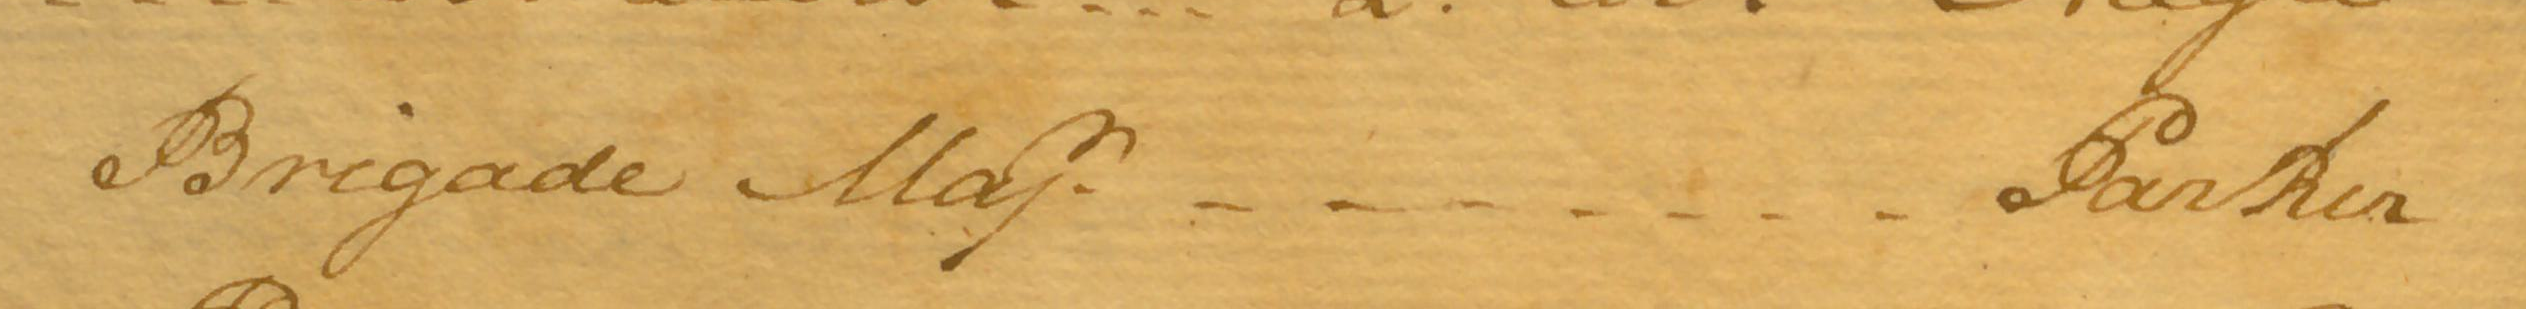Brigade Maj^r. ....... Parker
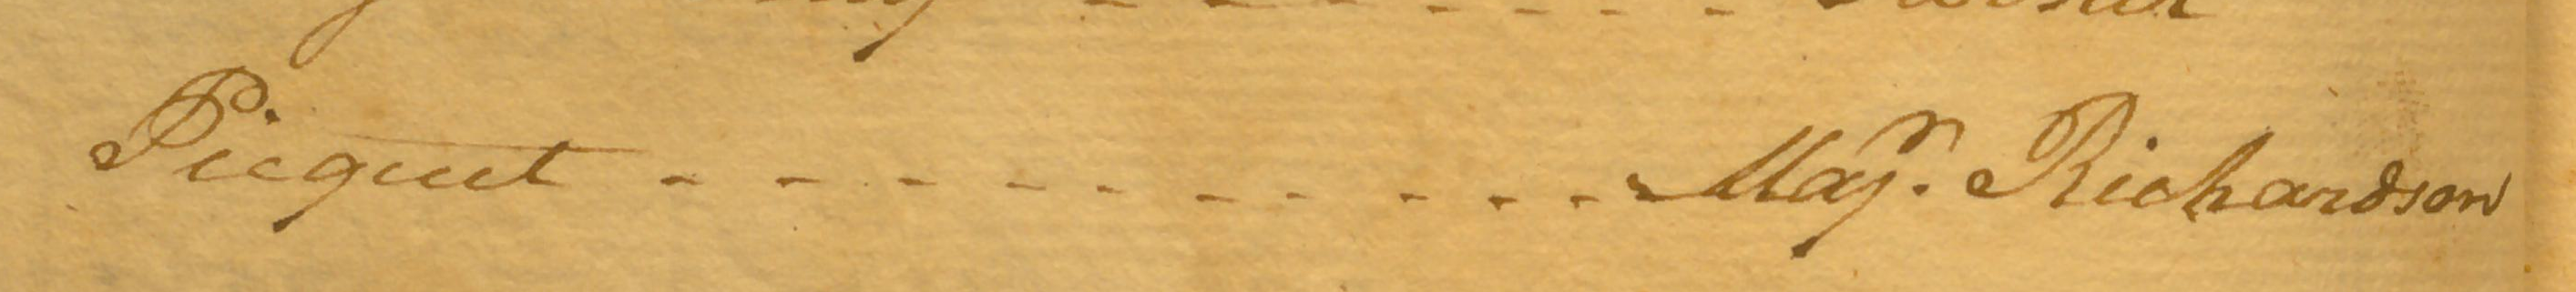Picquet .......... Maj^r. Richardson
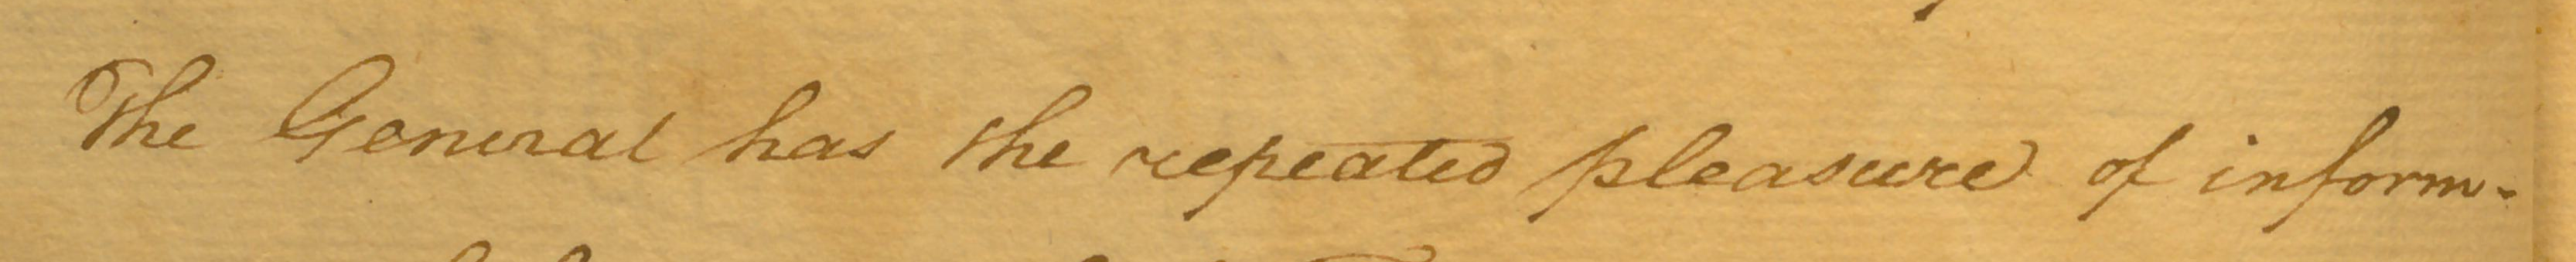The General has the repeated pleasure of inform-
